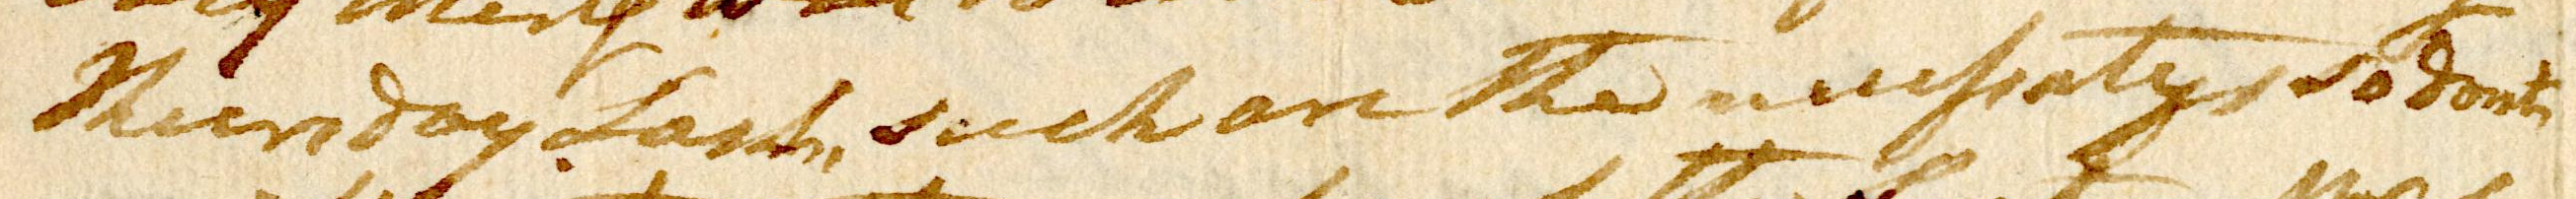thursday Last such are the necessatys so dont
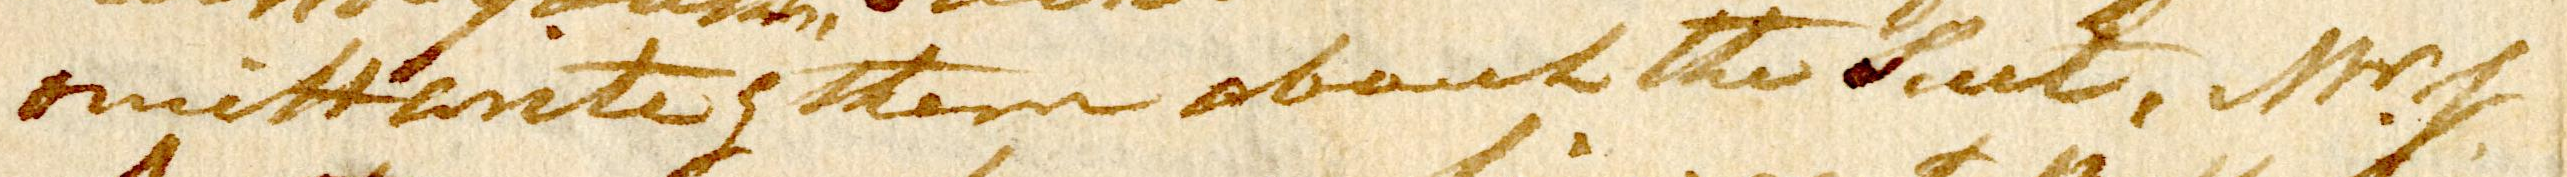remitt writeg them about the Suit, M^r. J
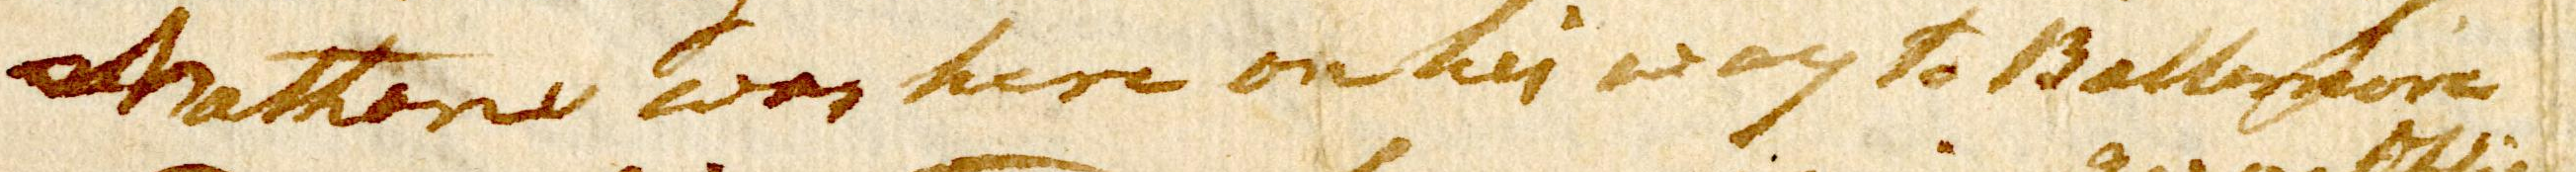Hathorne was here on his way to Baltimore
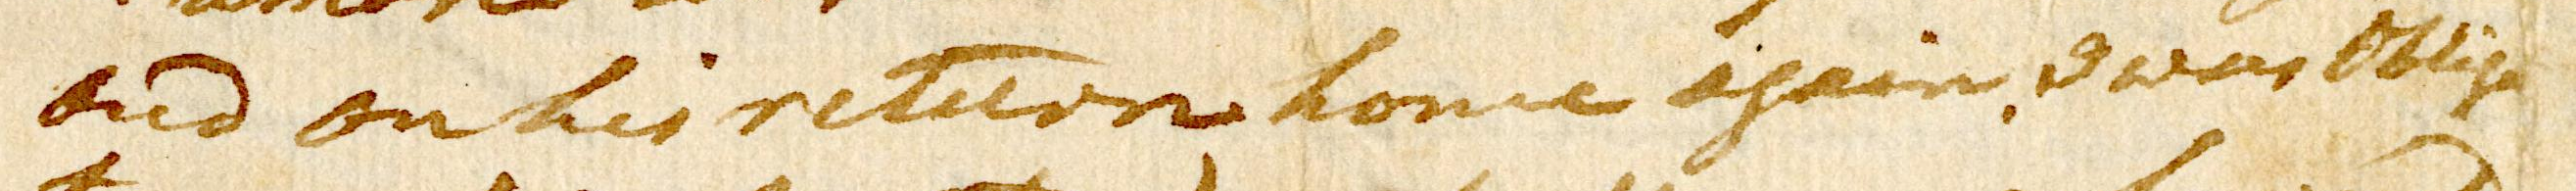and on his return home again, I was obligd
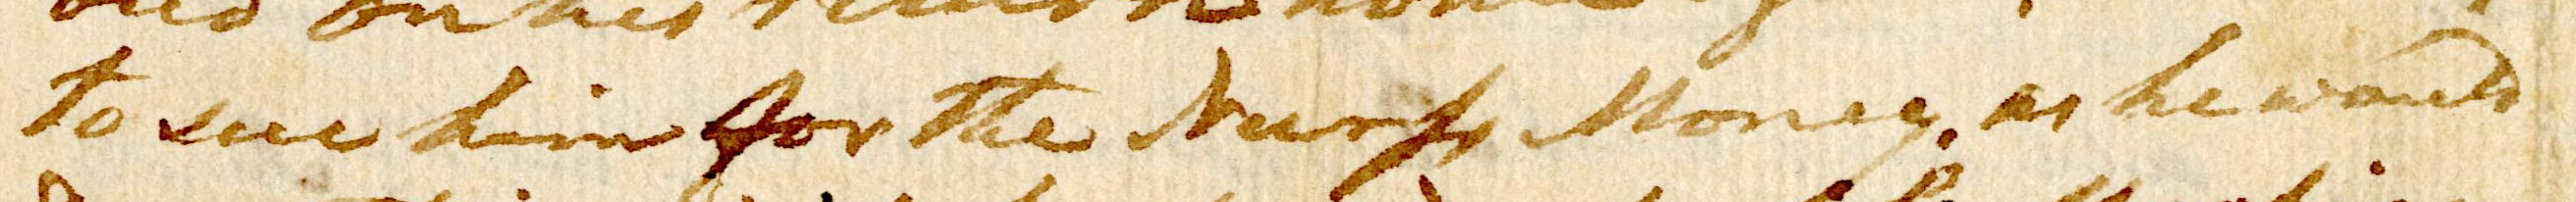to see him for the Nearss Money, as he would
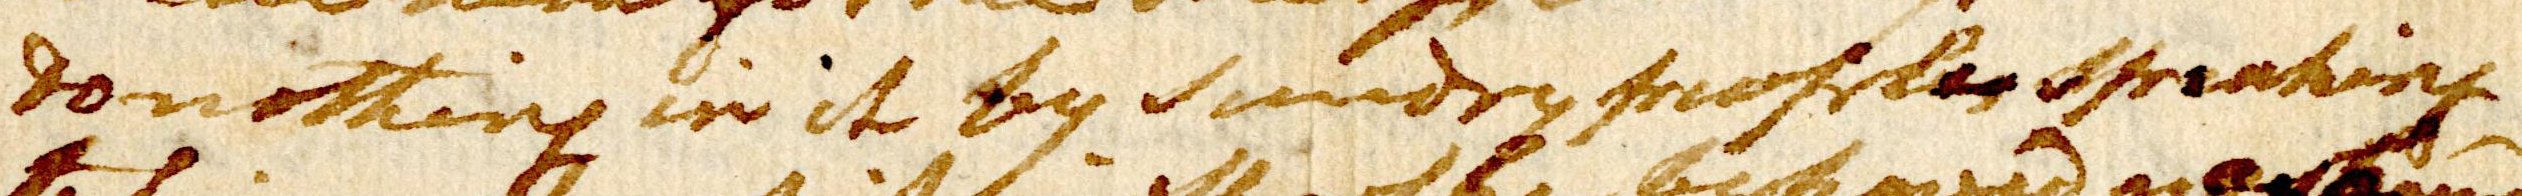do nothing in it by sundry peoples speaking
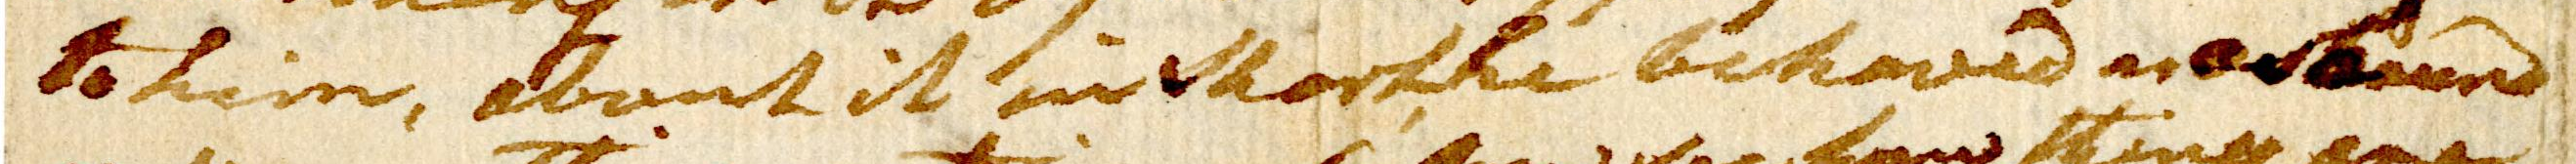to him, about it in short, he behaved as assurd
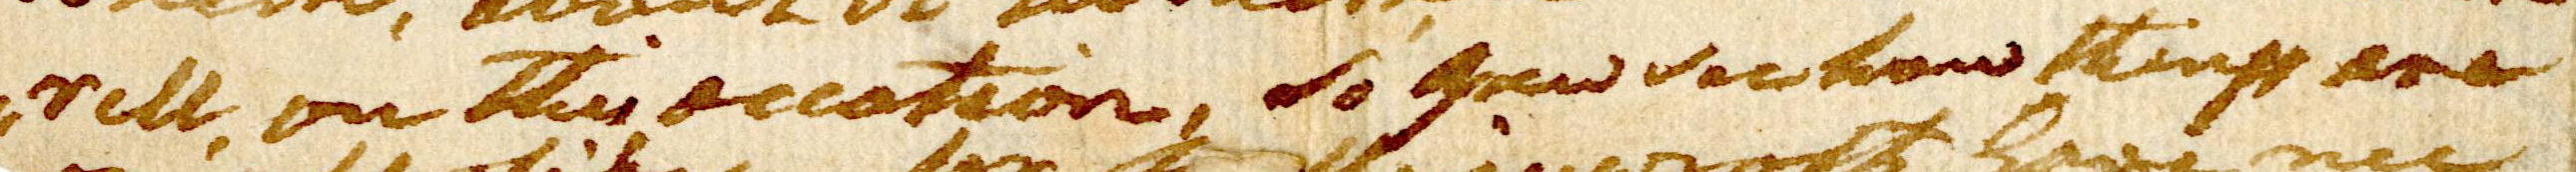-rell on this occasion, so you see how things are
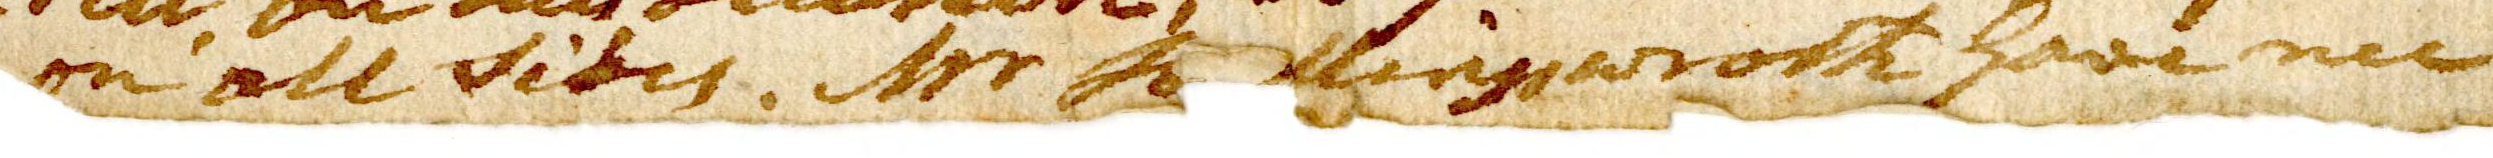on all sides, M^r Hollingsworth gave me
